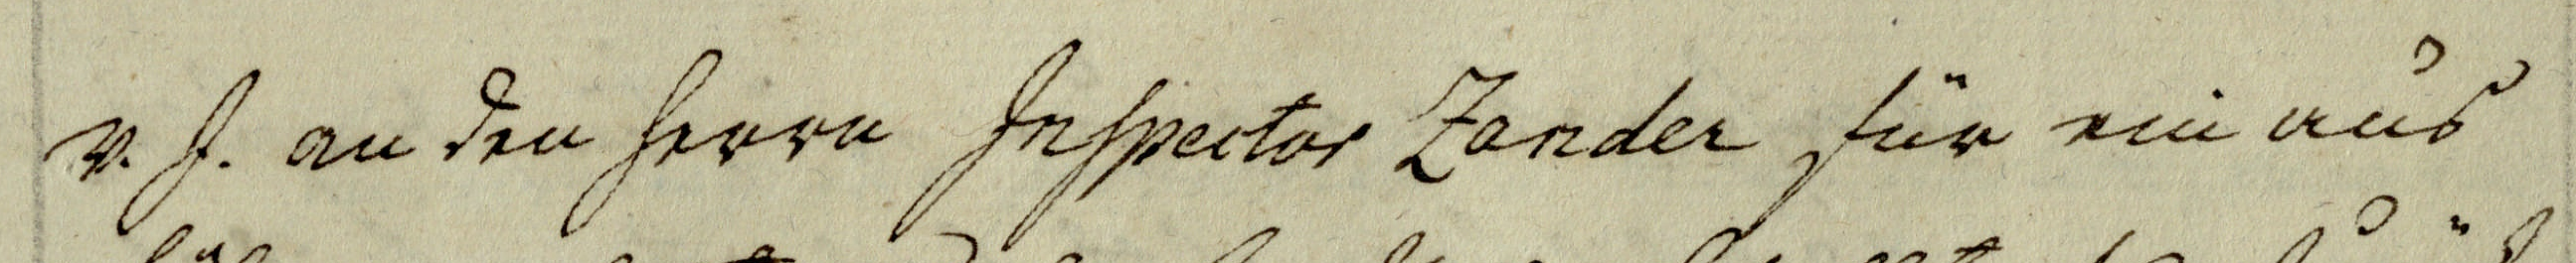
v. J. an den Herrn Inspector Zander für ein aus
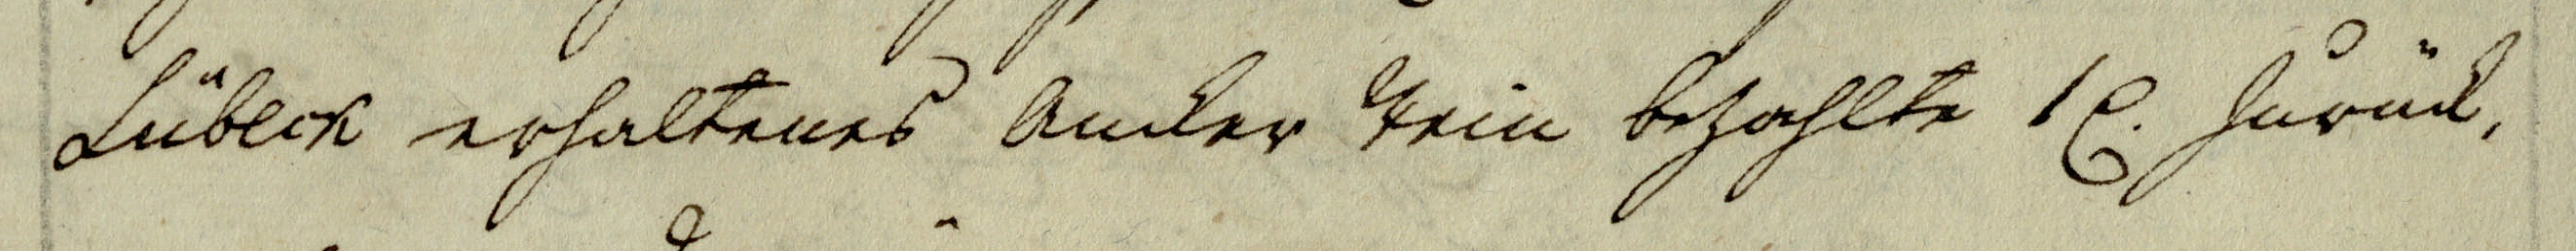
Lübeck erhaltenes Ancker Wein bezahlte 1 l. zurück¬
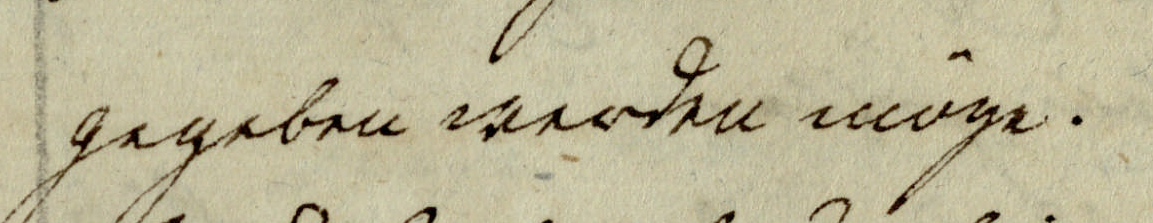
gegeben werden möge.
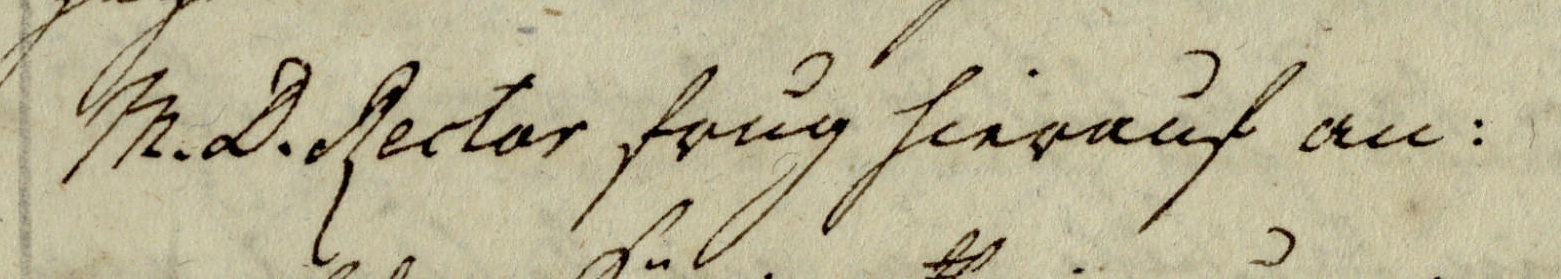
M. D. Rector frug hierauf an:
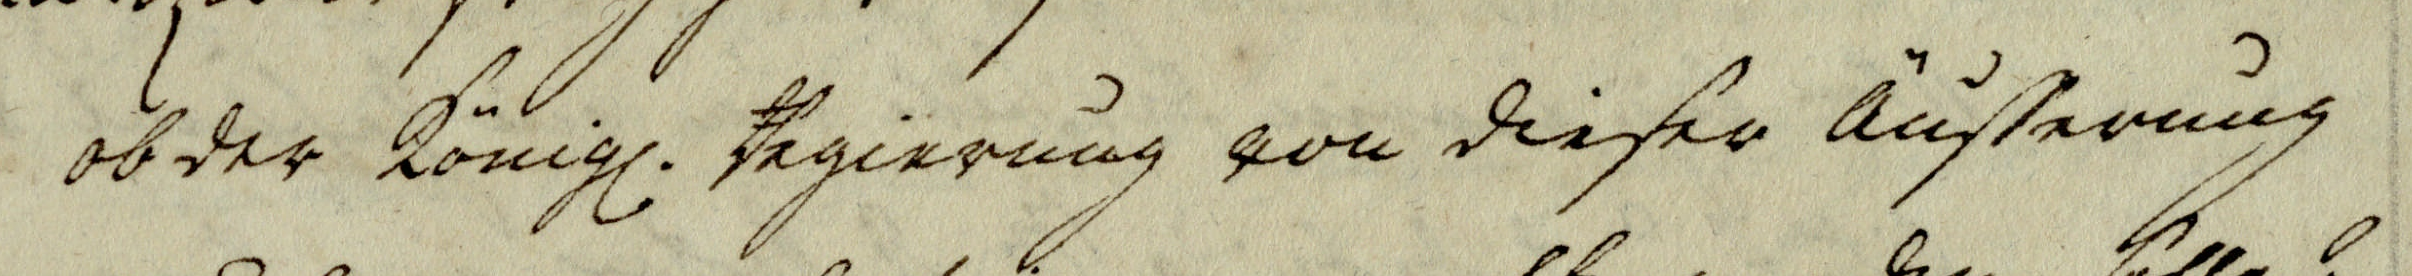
ob der Königl. Regierung von dieser Äusserung
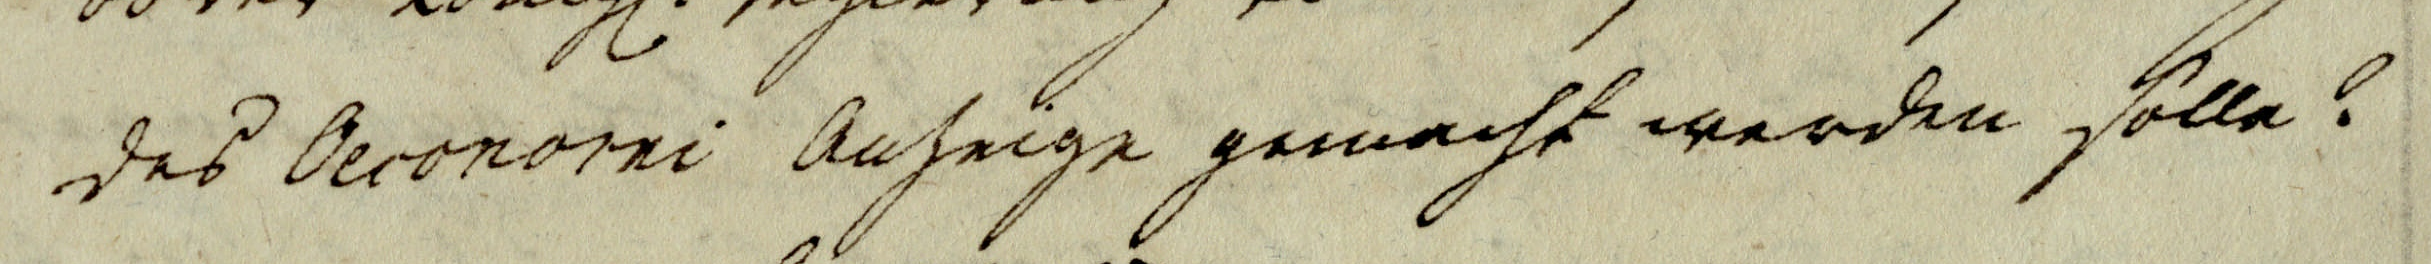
des Oeconomi Anzeige gemacht werden solle?
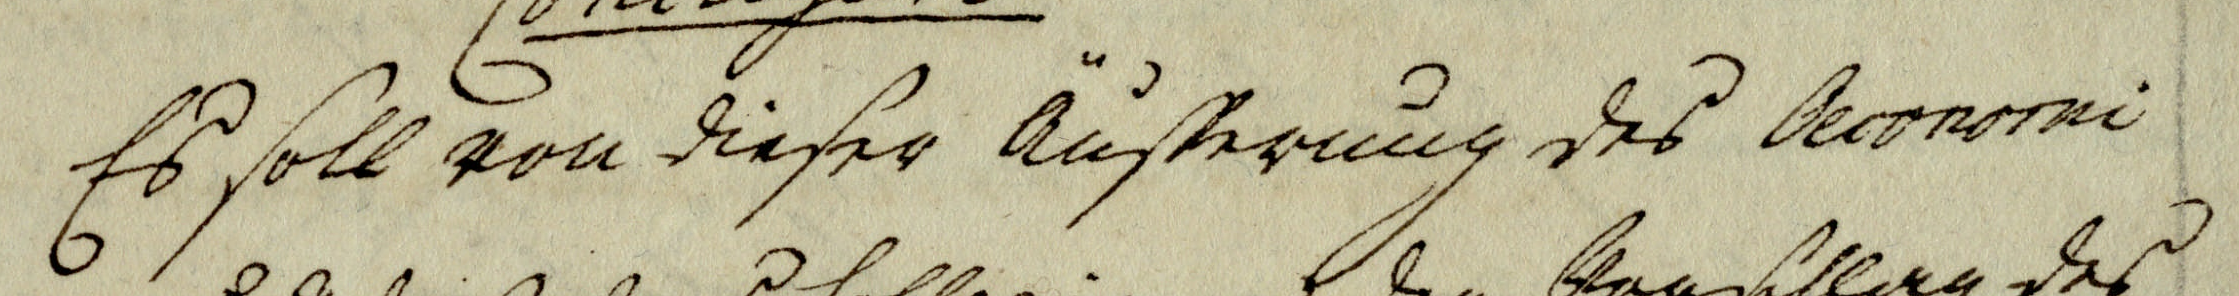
Es soll von dieser Äusserung des Oeconomi
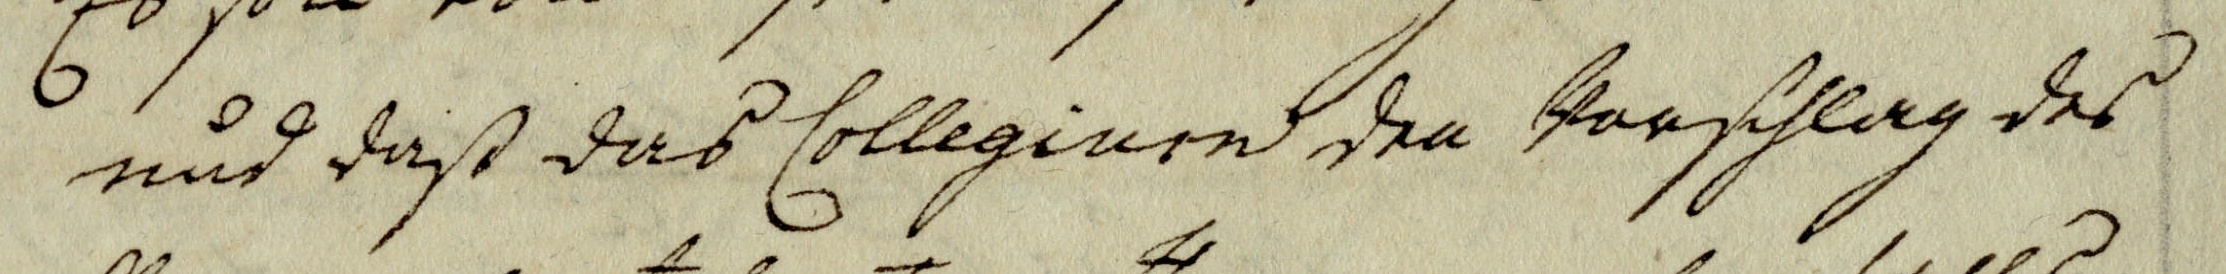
und daß das Collegium den Vorschlag des
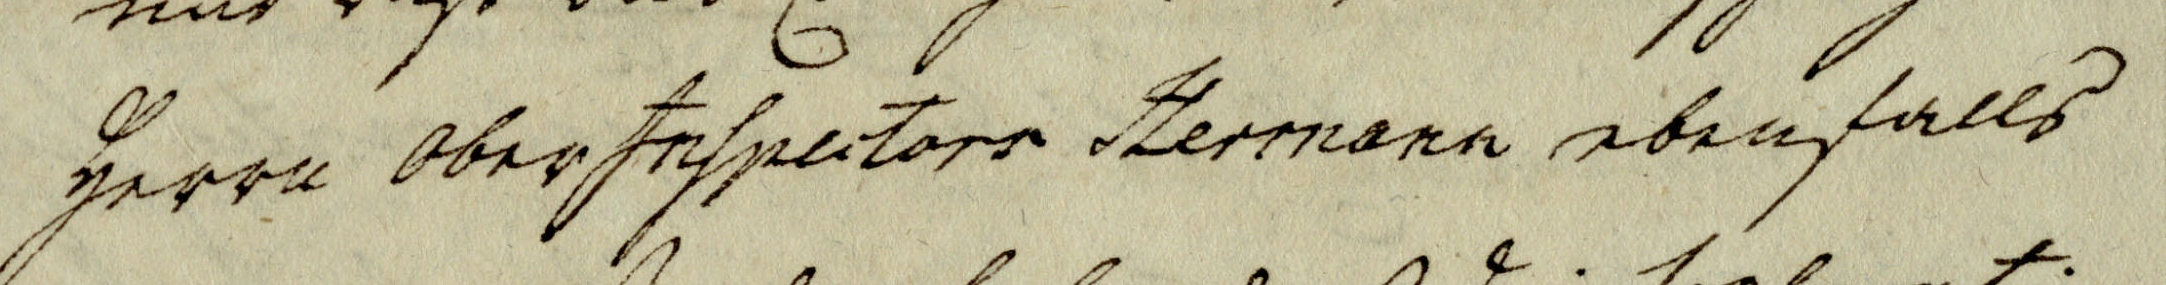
Herrn OberInspectors Hermann ebenfalls
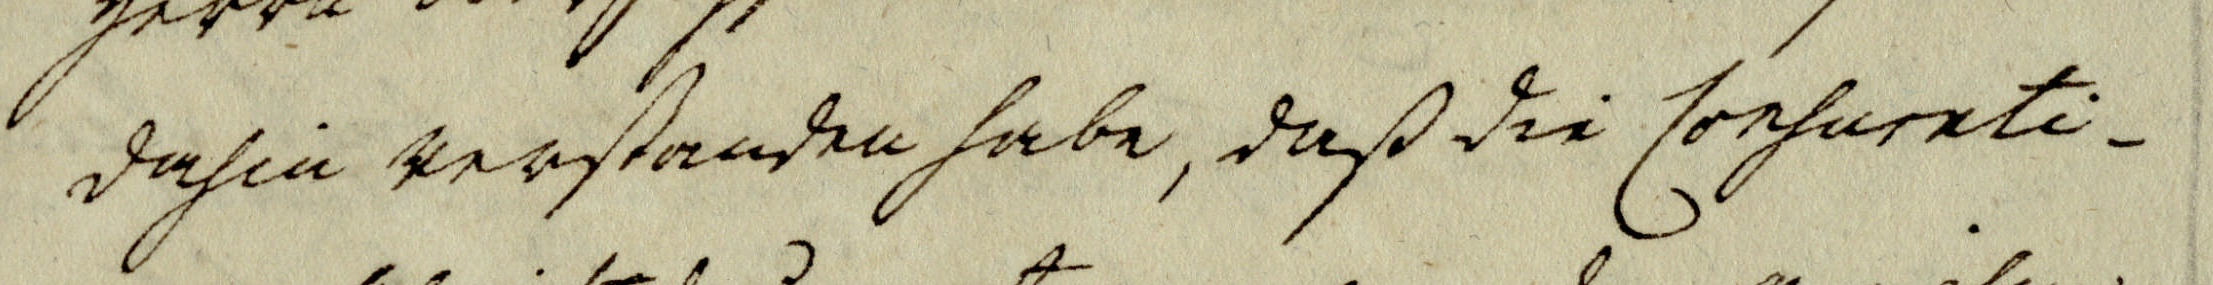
dahin verstanden habe, daß die Consumti¬
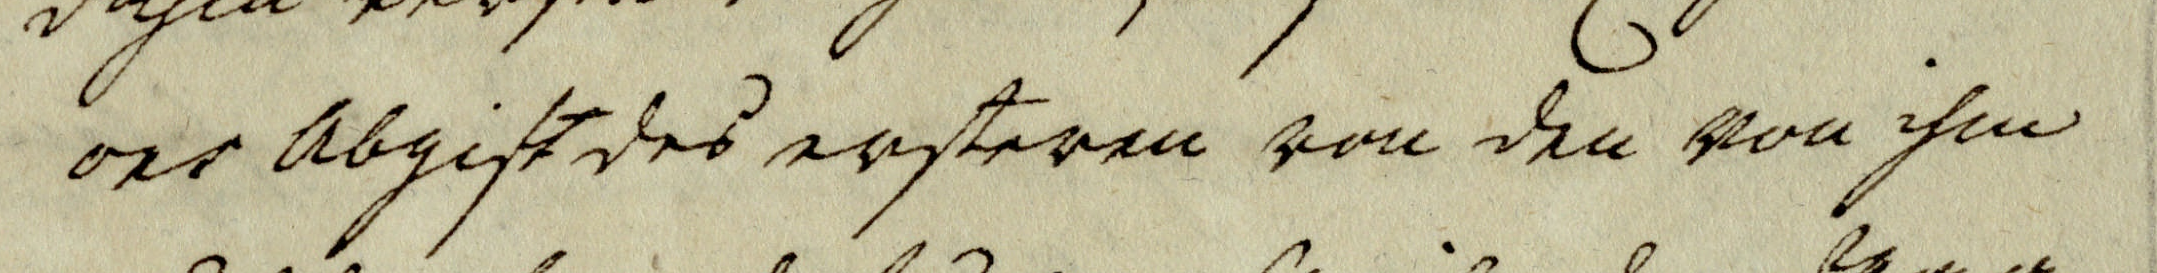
ons Abgift des ersteren von den von ihm
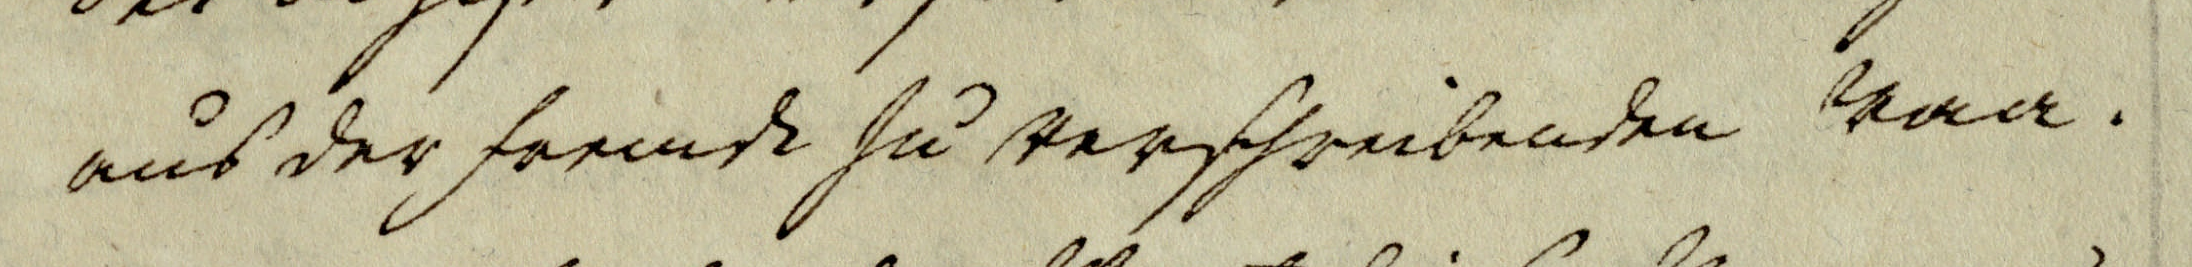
aus der Fremde zu verschreibenden Waa¬
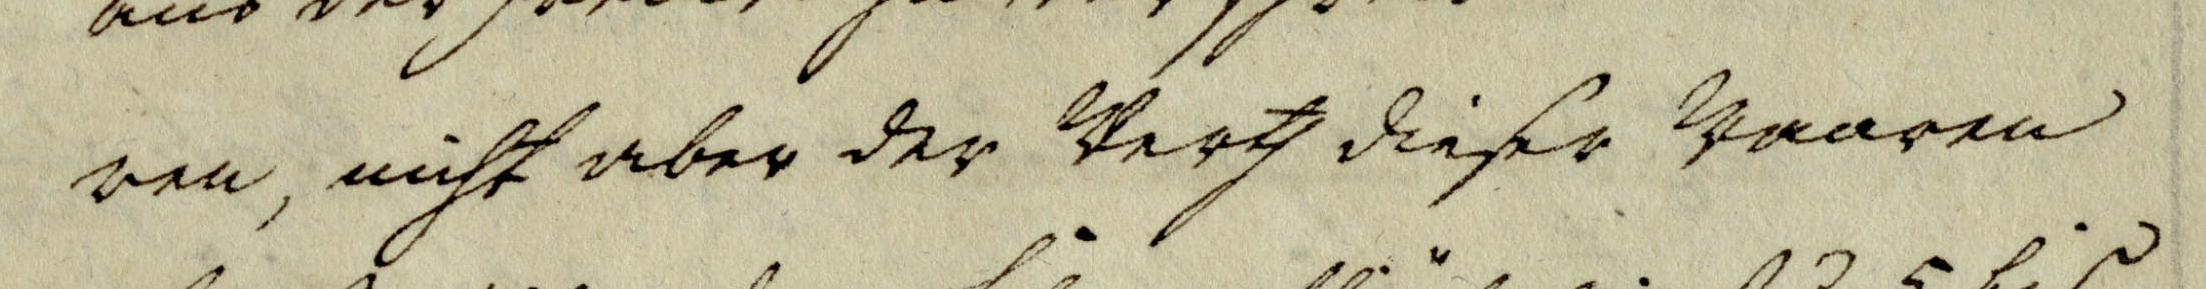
ren, nicht aber der Werth dieser Waaren
